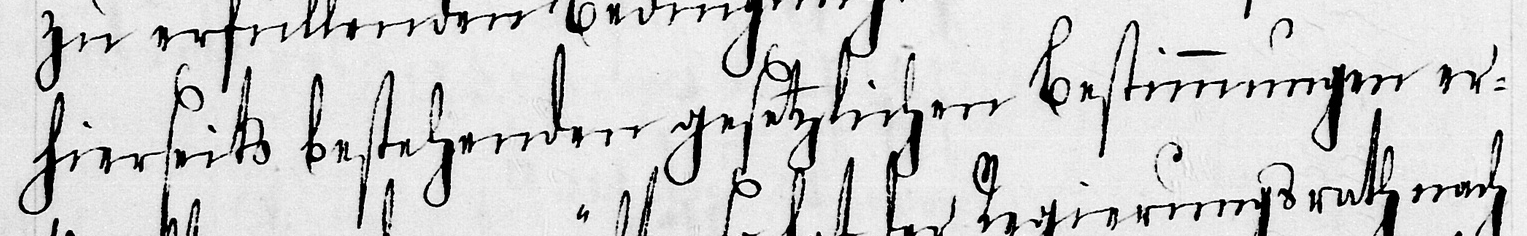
hierseits bestehenden gesetzlichen Bestimmungen er¬
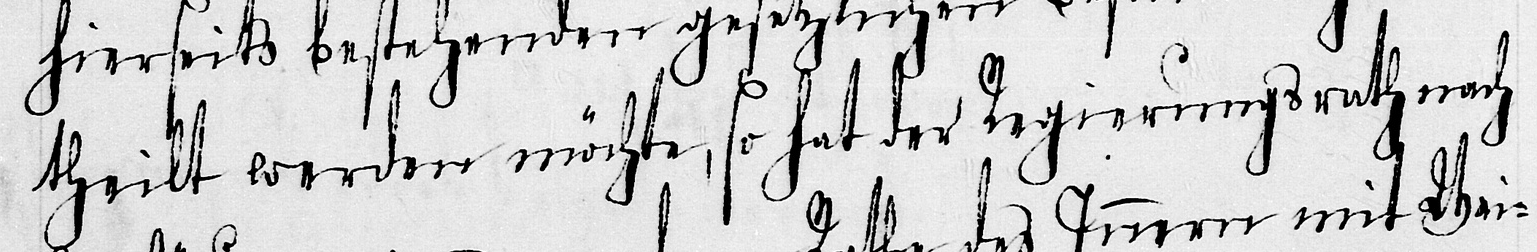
theilt werden möchte, so hat der Regierungsrath nach
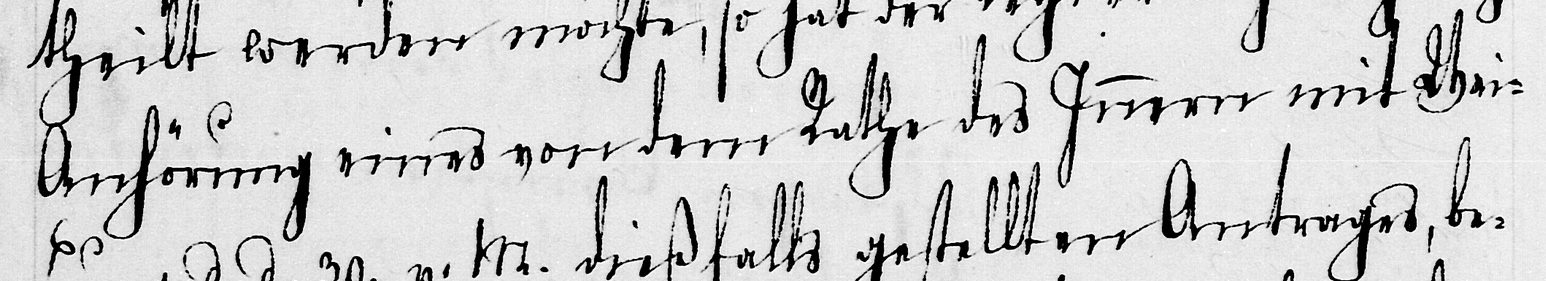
Anhörung eines von dem Rathe des Innern mit Wei¬
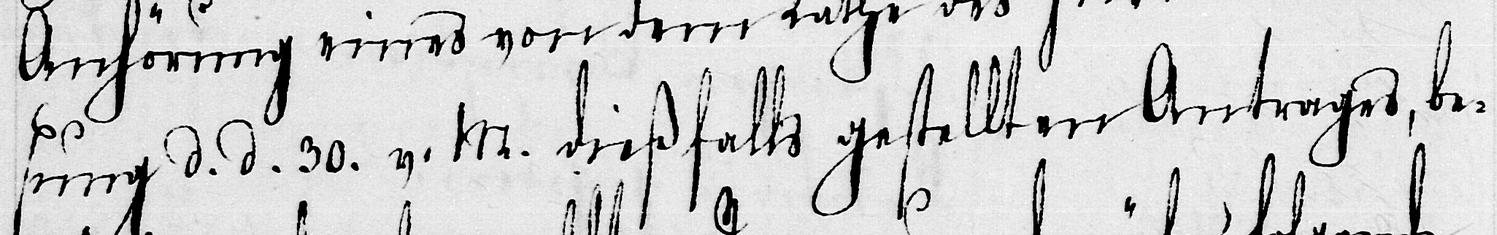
sung d. d. 30. v. M. dießfalls gestellten Antrages, be¬
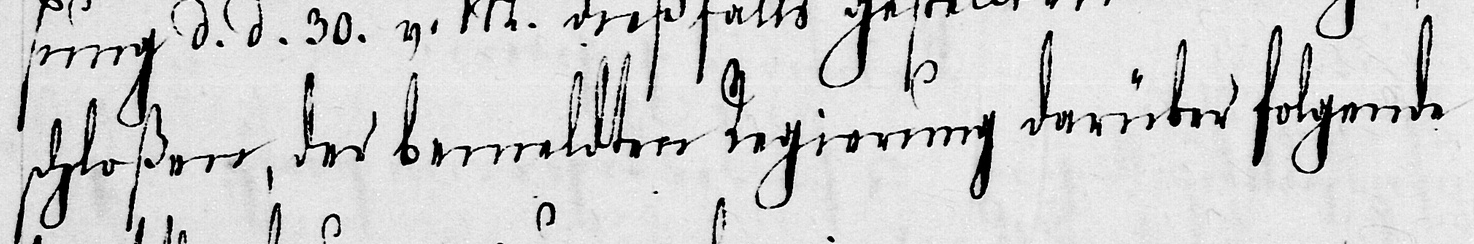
schloßen, der bemeldten Regierung darüber folgende
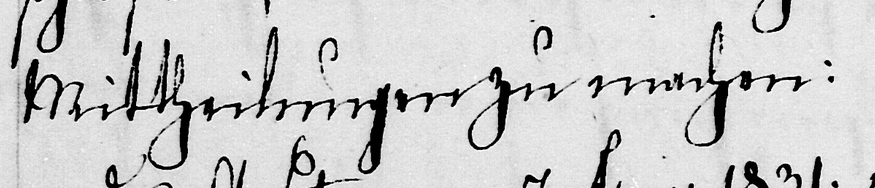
Mittheilungen zu machen:
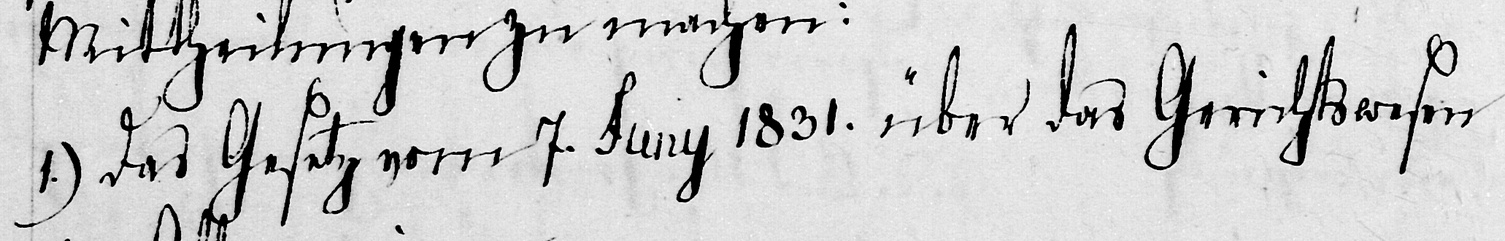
1.) Das Gesetz vom 7. Juny 1831. über das Gerichtswesen
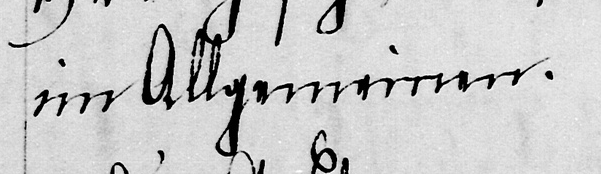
im Allgemeinen.
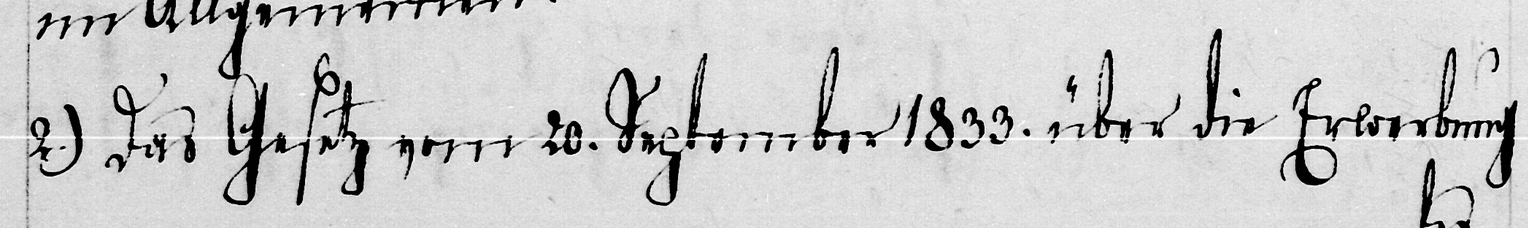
2.) Das Gesetz vom 20. September 1833. über die Erwerbung
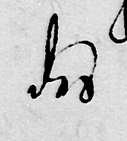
des
